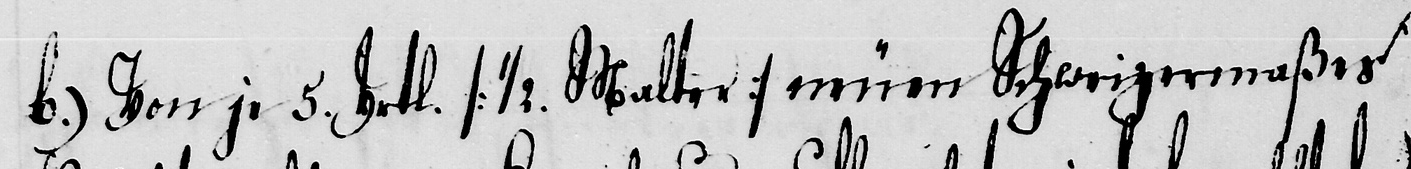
b.) Von je 5. Vrtl. [1/2 Malter] neuen Schweizermaßes
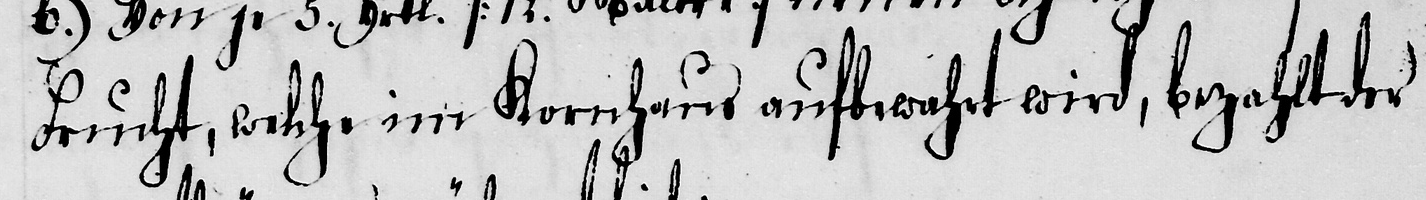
Frucht, welche im Kornhaus aufbewahrt wird, bezahlt der
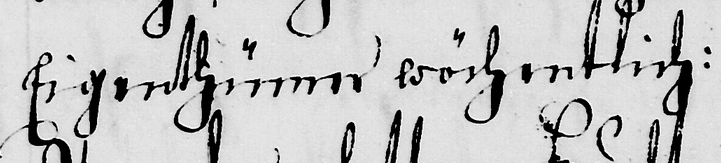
Eigenthümer wöchentlich:
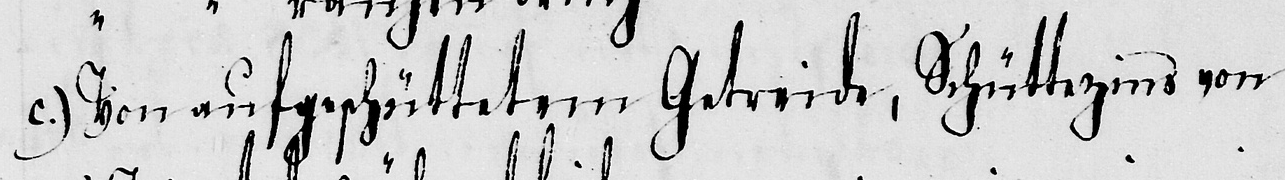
c.) Von aufgeschüttetem Getreide Schüttezins von
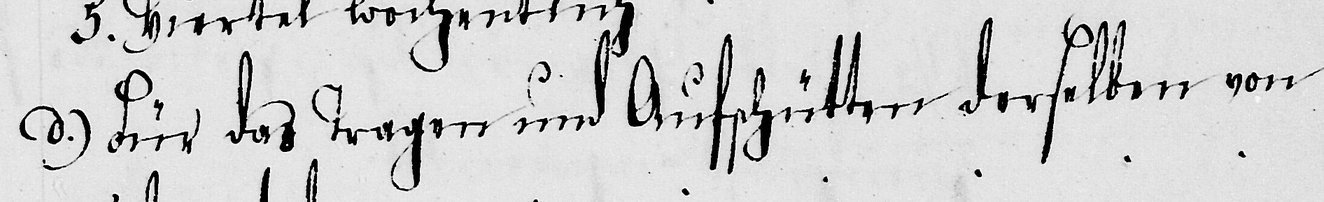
d.) Für das Tragen und Aufschütten derselben von
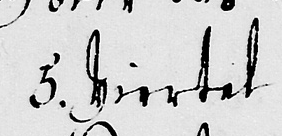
5. Vierte¬
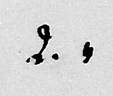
5.
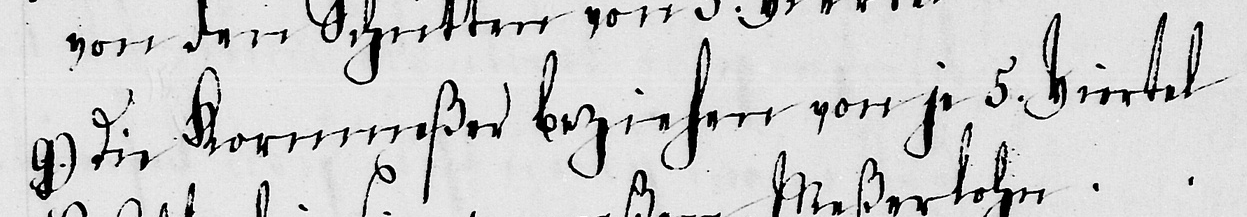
g.) Die Kornmeßer beziehen von je 5. Viertel
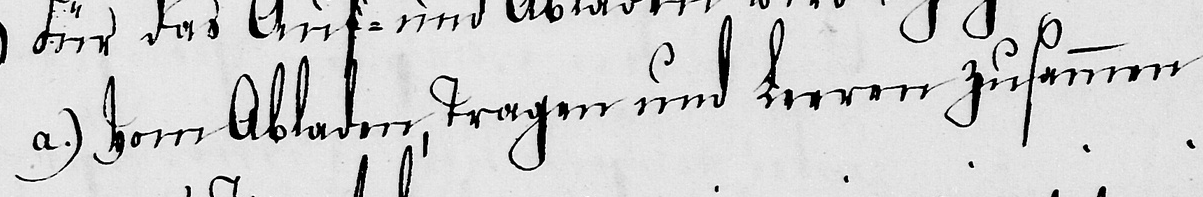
a.) Vom Abladen, Tragen und Leeren zusammen
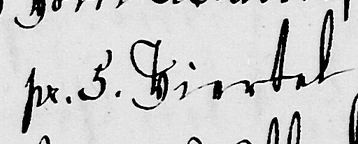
pr. 5. Vierte¬
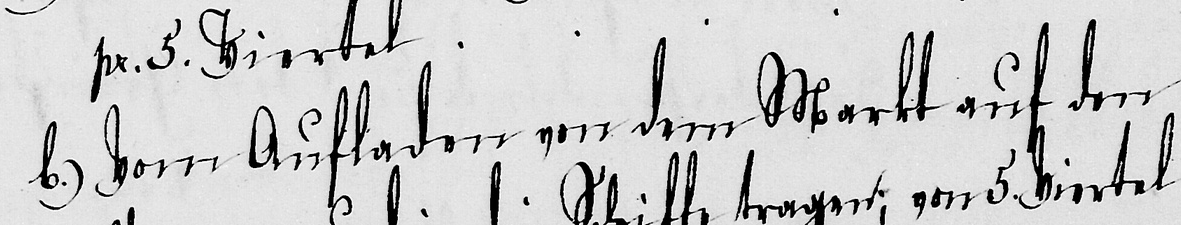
b.) Vom Aufladen von dem Markt auf den
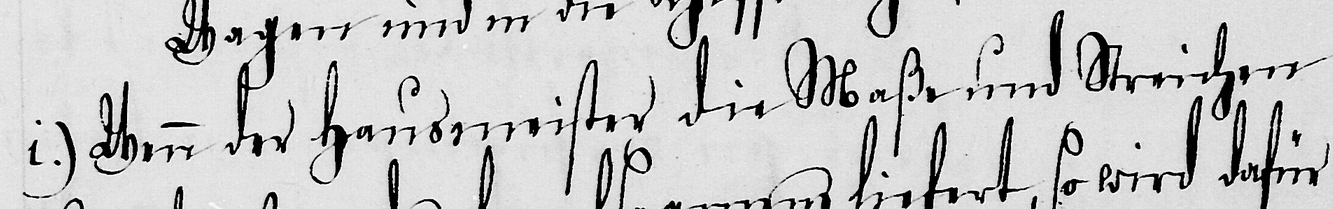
i.) Wenn der Hausmeister die Maße und Streichern
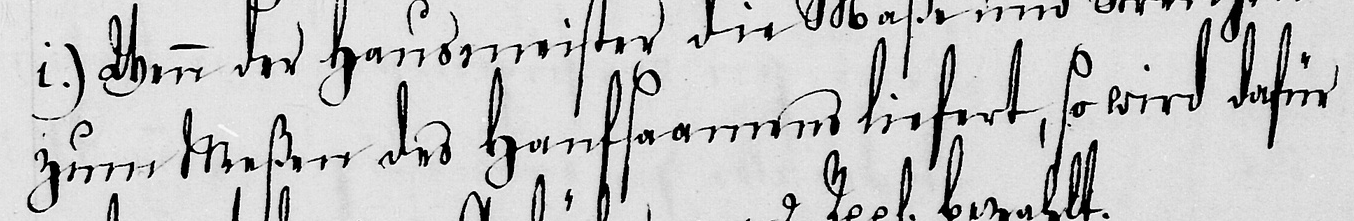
zum Meßen des Hanfsaamens liefert, so wird dafür
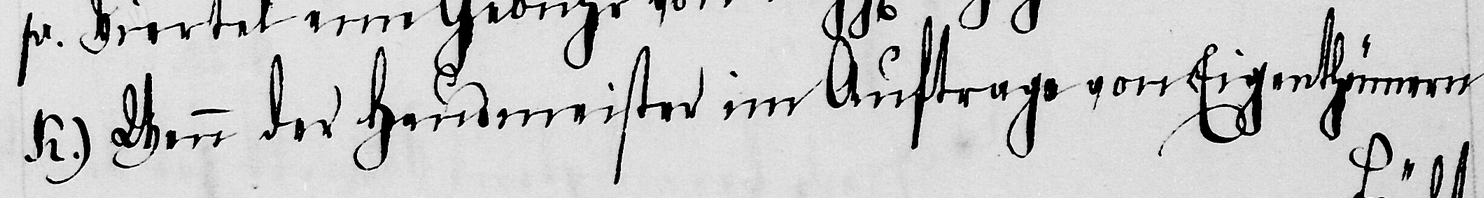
k.) Wenn der Hausmeister im Auftrage von Eigenthümern
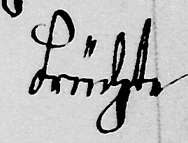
Frucht,
